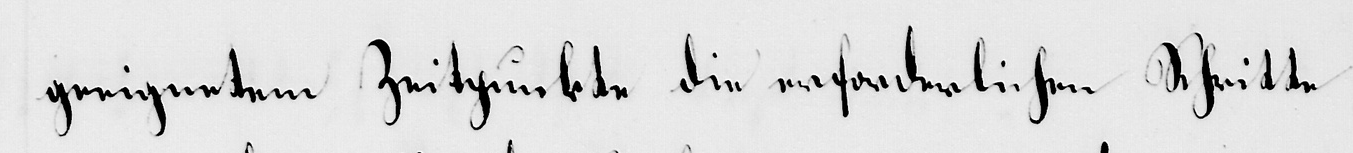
geeignetem Zeitpunkte die erforderlichen Schritte
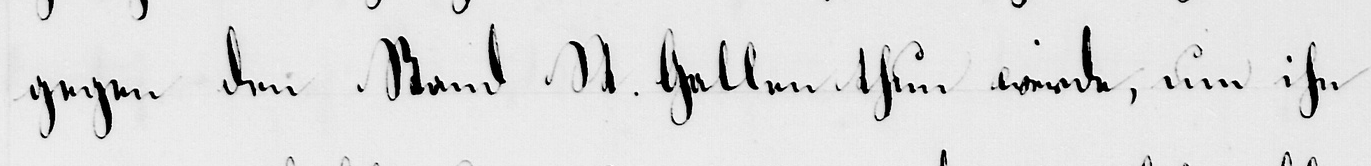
gegen den Stand St. Gallen thun werde, um ihn
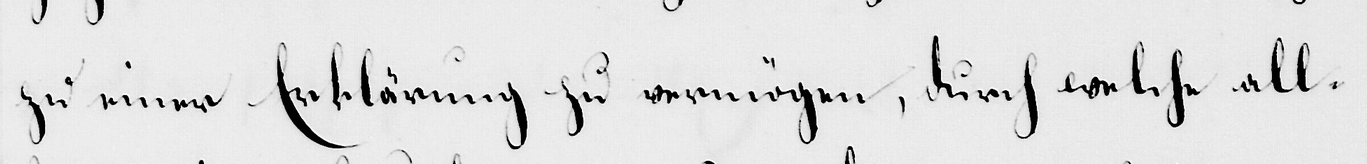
zu einer Erklärung zu vermögen, durch welche all¬
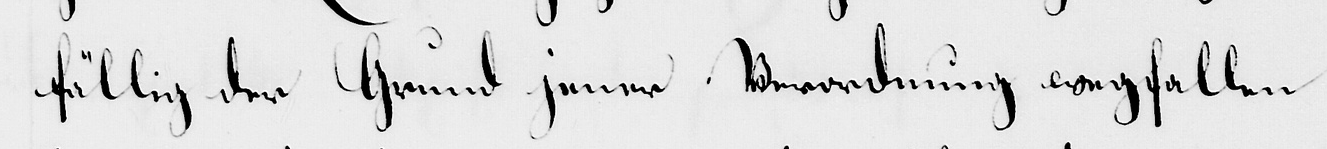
fällig der Grund jener Verordnung wegfallen
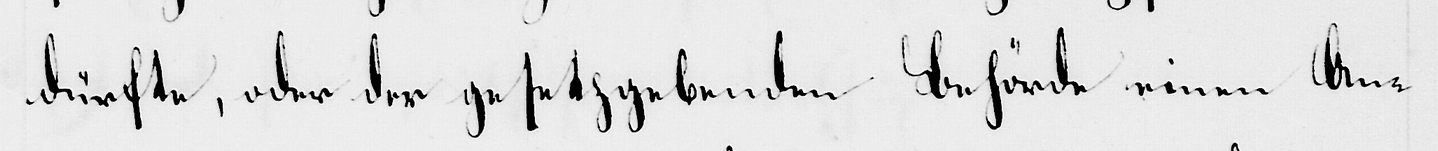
dürfte, oder der gesetzgebenden Behörde einen An¬
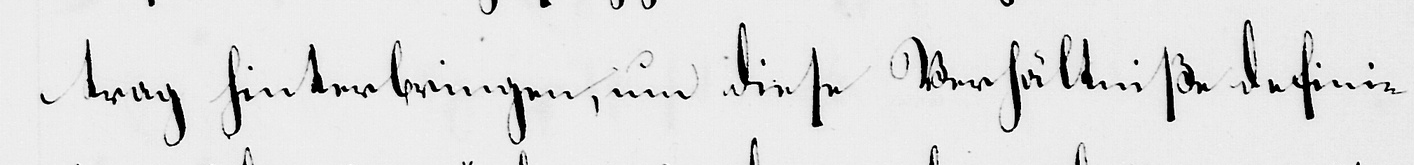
trag hinterbringen, um diese Verhältniße defini¬
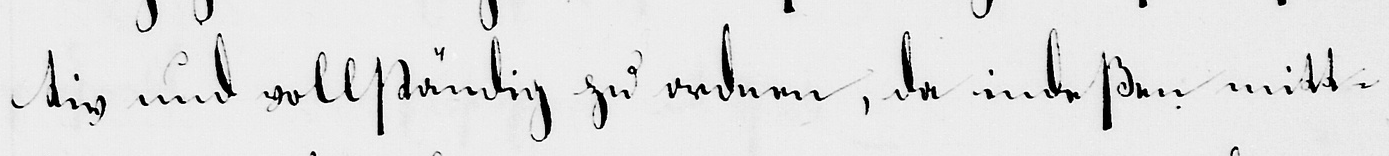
tiv und vollständig zu ordnen, da indeßen mitt¬
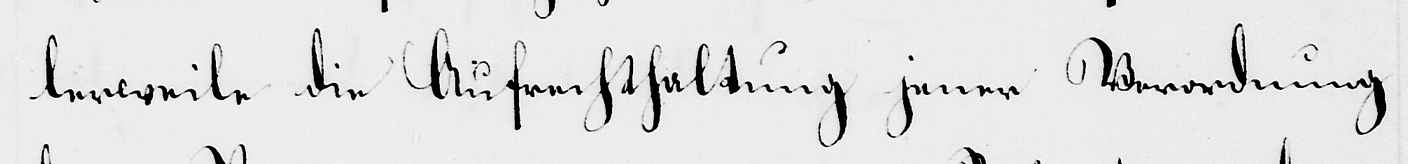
lerweile die Aufrechthaltung jener Verordnung
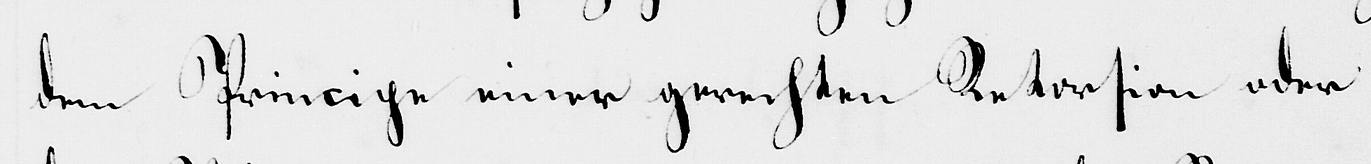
dem Principe einer gerechten Retorsion oder
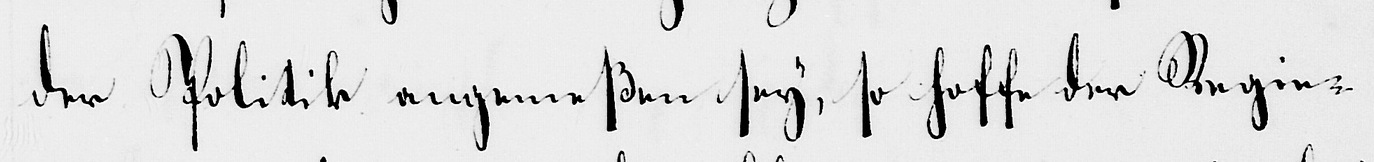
der Politik angemeßen sey, so hoffe der Regie¬
